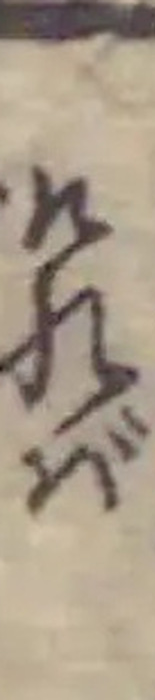ければ
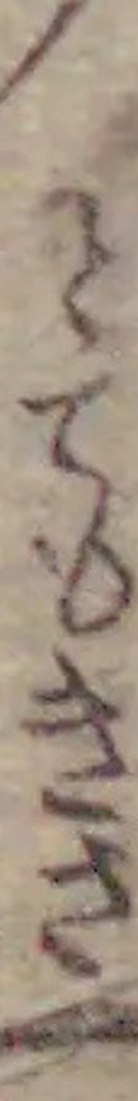とてもきさ
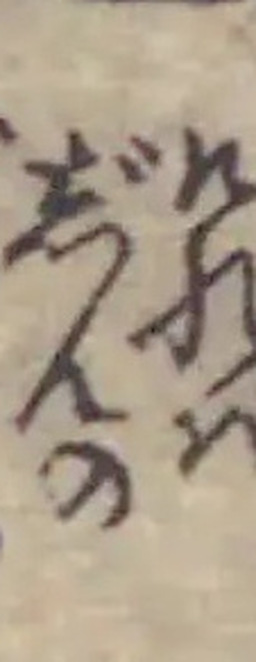じんの
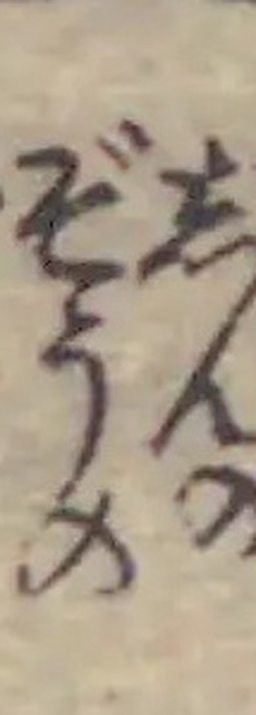ぞうの
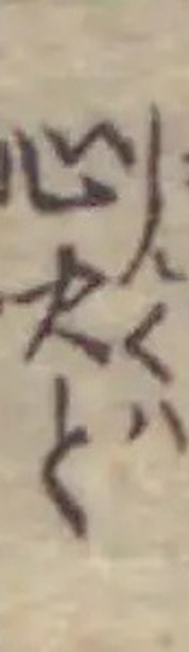心火と
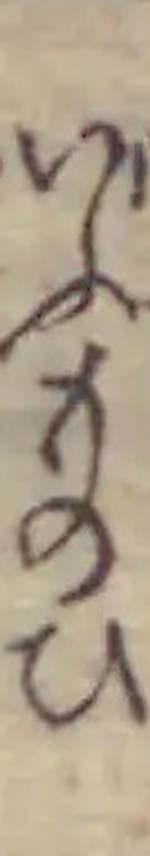いふものひ
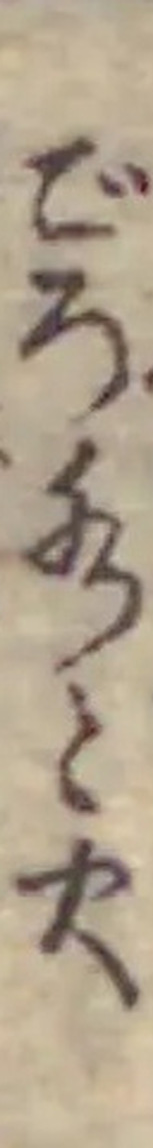ごろ水と火
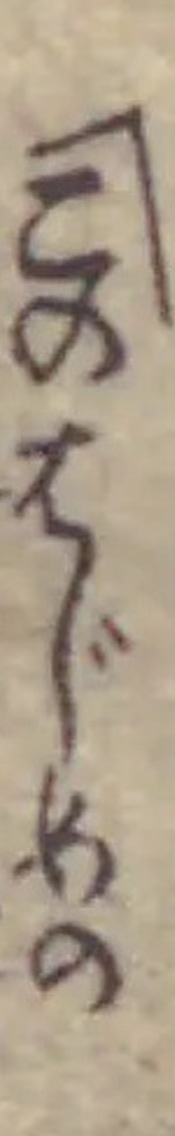〽このはじめの
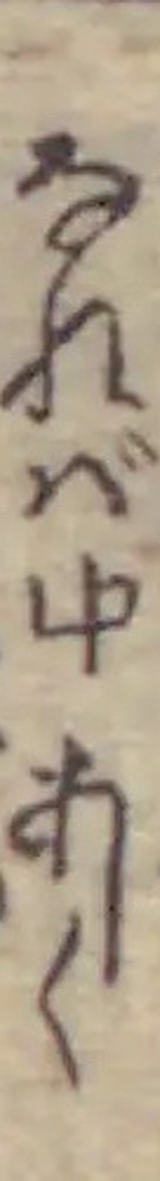なれば中あしく
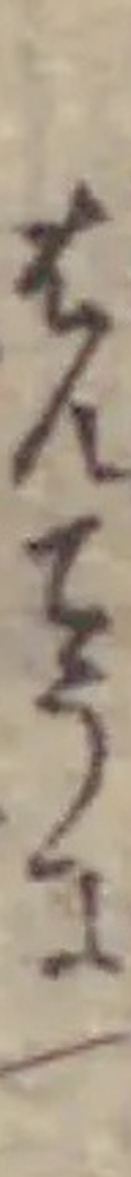はんこうに
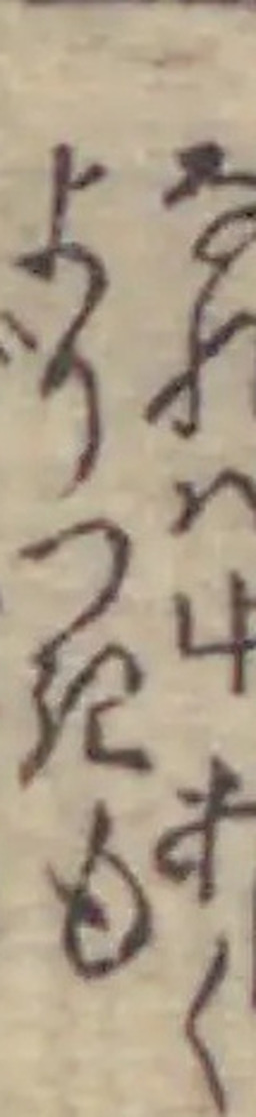よりつきも
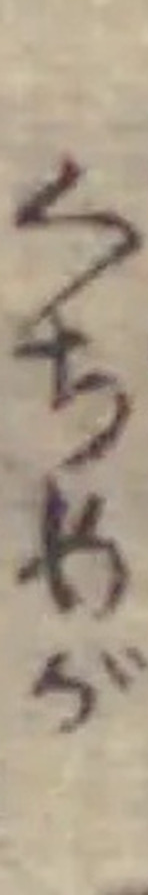くちめが
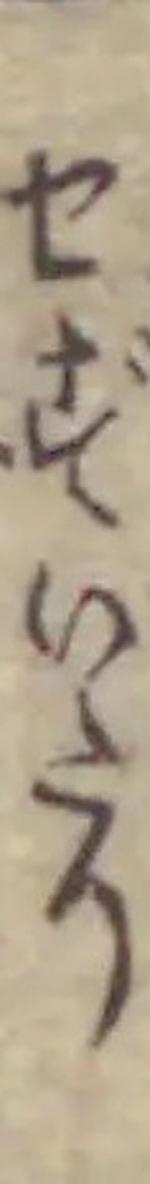せずいたり
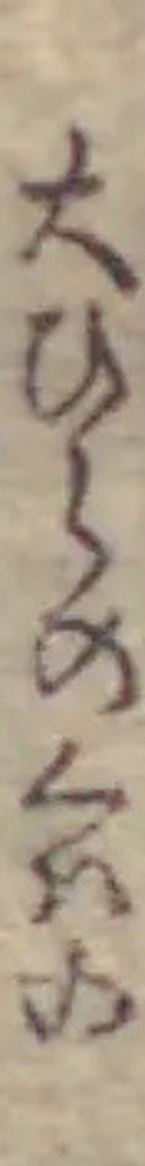大ひらのくはの
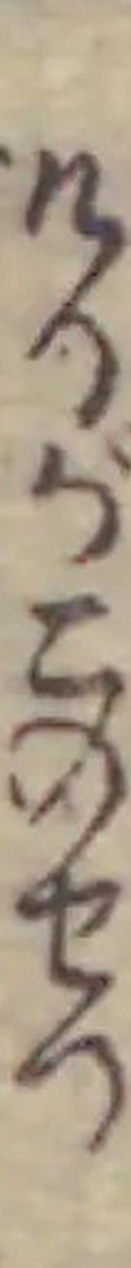けるがこのせつ
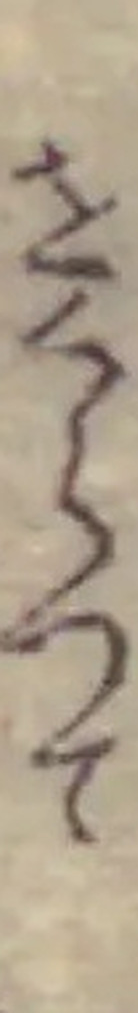をくらつて
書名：腹内養生主論 3巻
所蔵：国立国会図書館 National Diet Library, JAPAN
